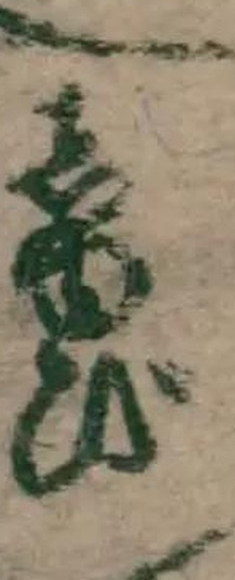しゆび
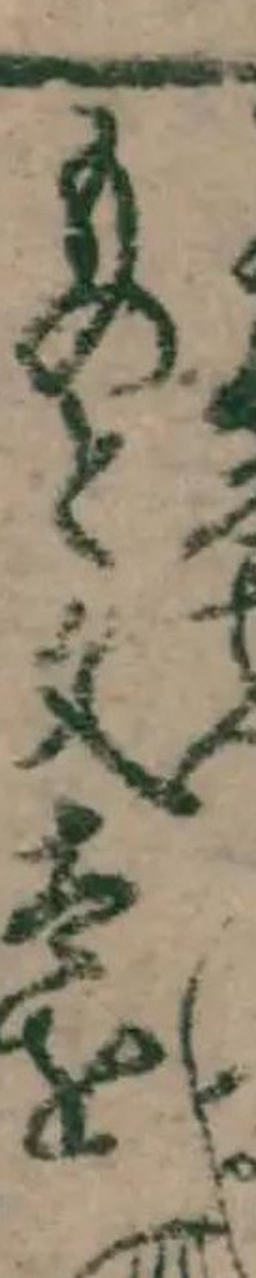ものと文太を
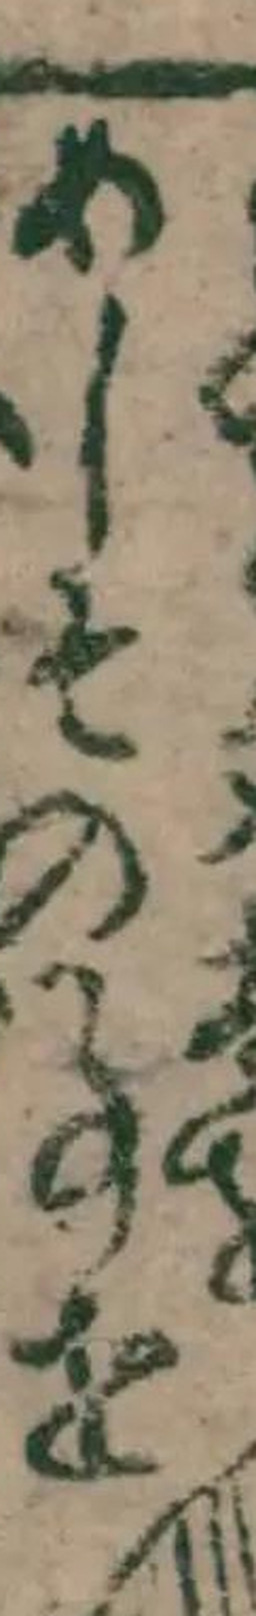めしその事を
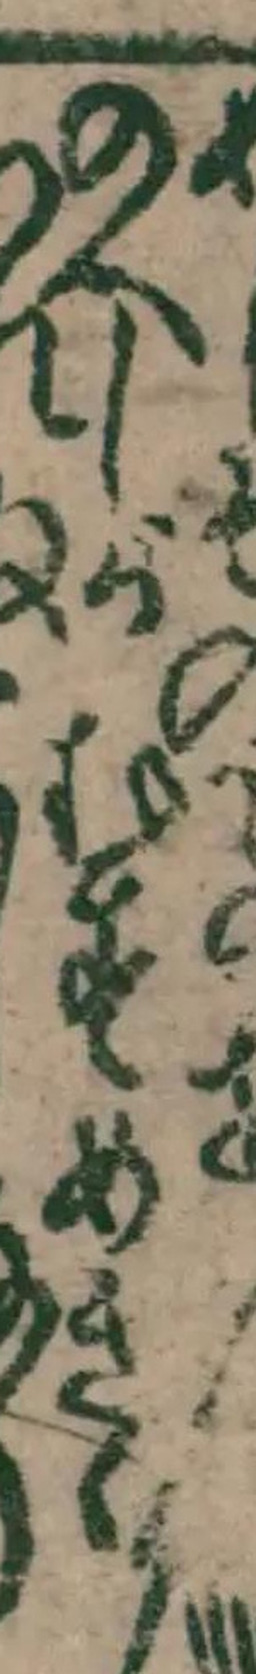のへしがむすめきゝ
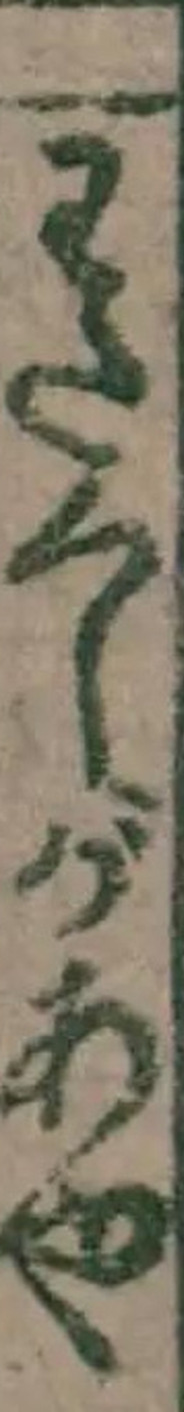わたくしがあや
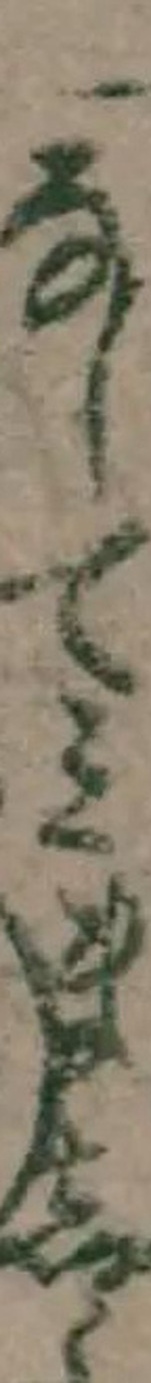なしてみましよ
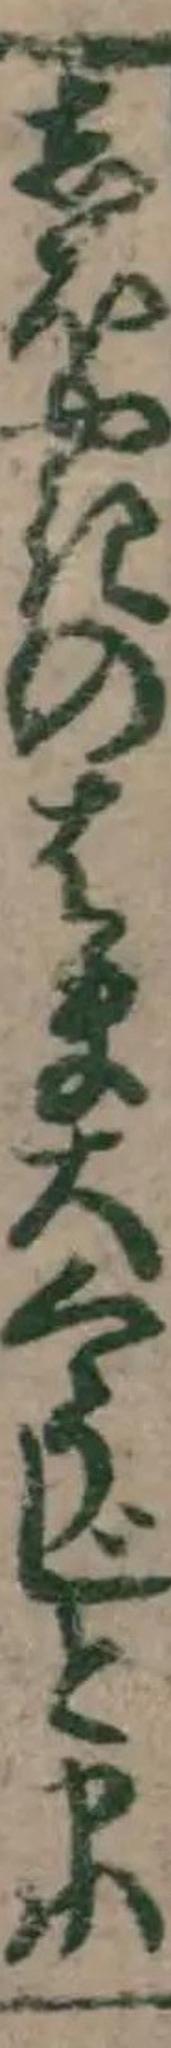しほやきのはま大くうじと申は
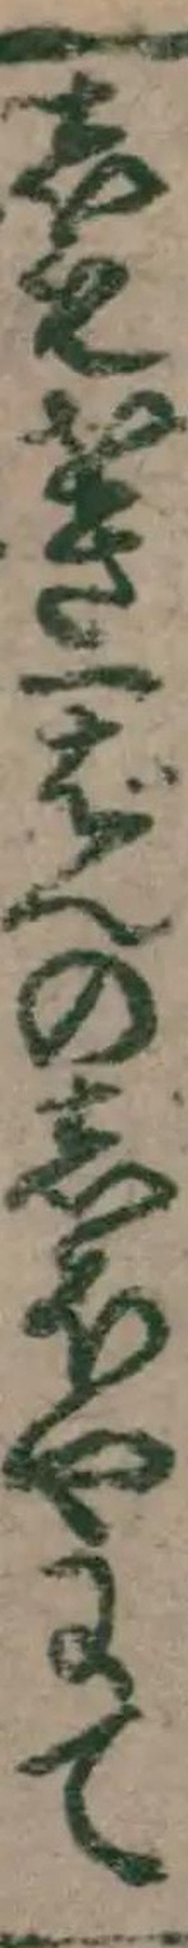しもをさ一ばんのしほやにて
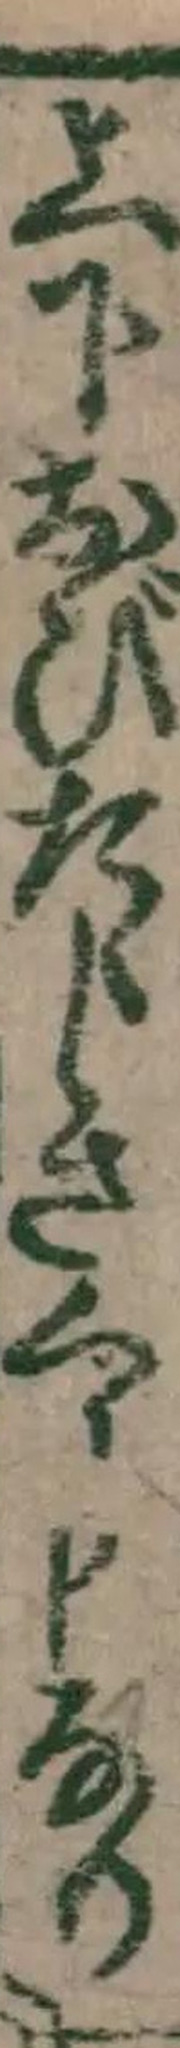上下おびたゝしきくらしなり
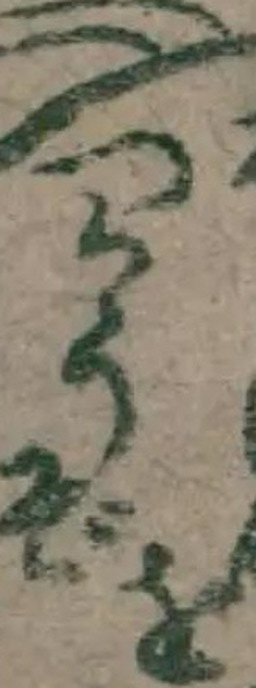つかうぞ

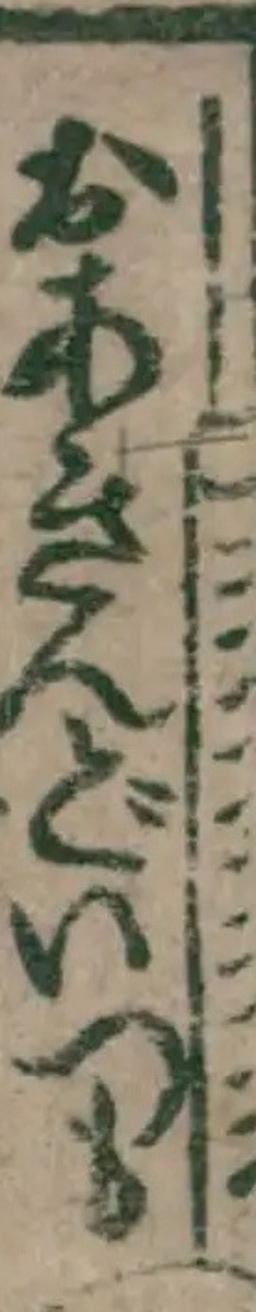おあきんどいつも
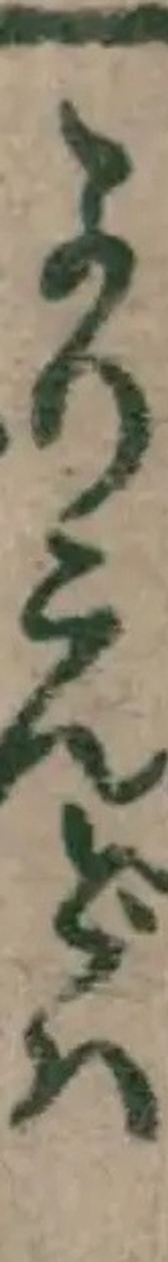よりこんどは
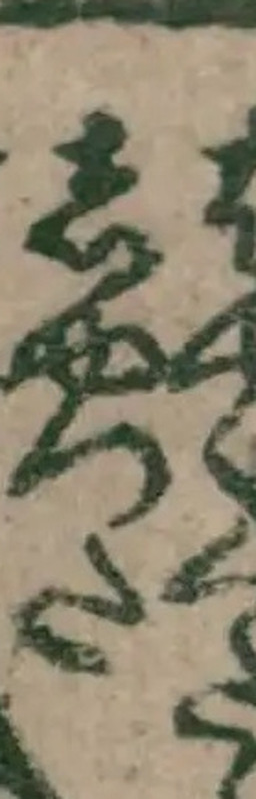しやつた
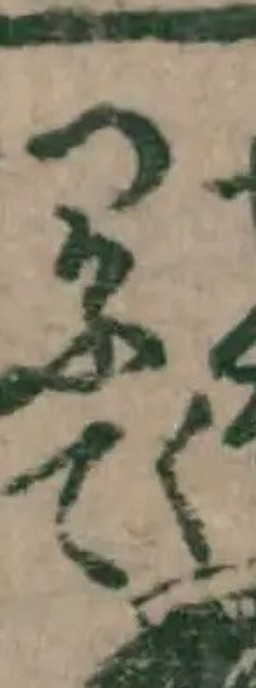つかふて
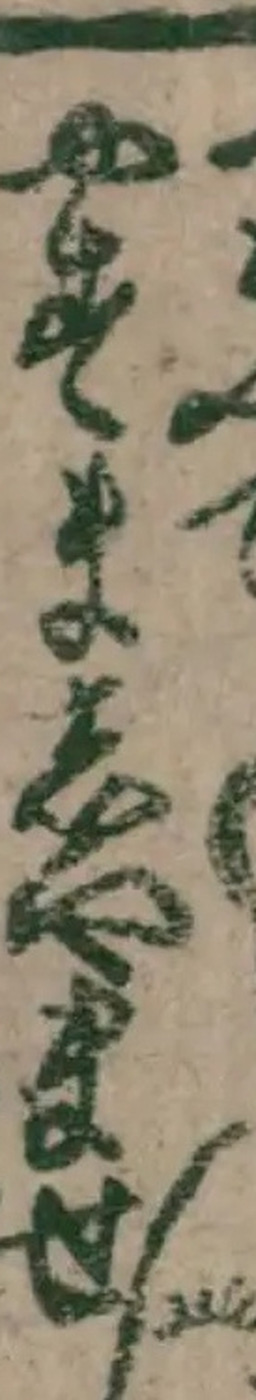やすましやませ
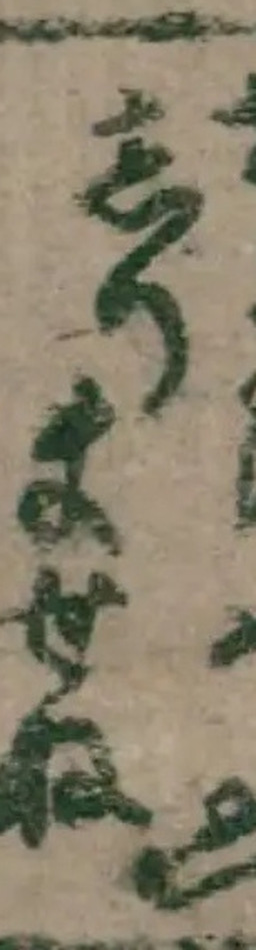しりませぬ
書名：塩売文太物語 2巻
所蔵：国立国会図書館 National Diet Library, JAPAN
